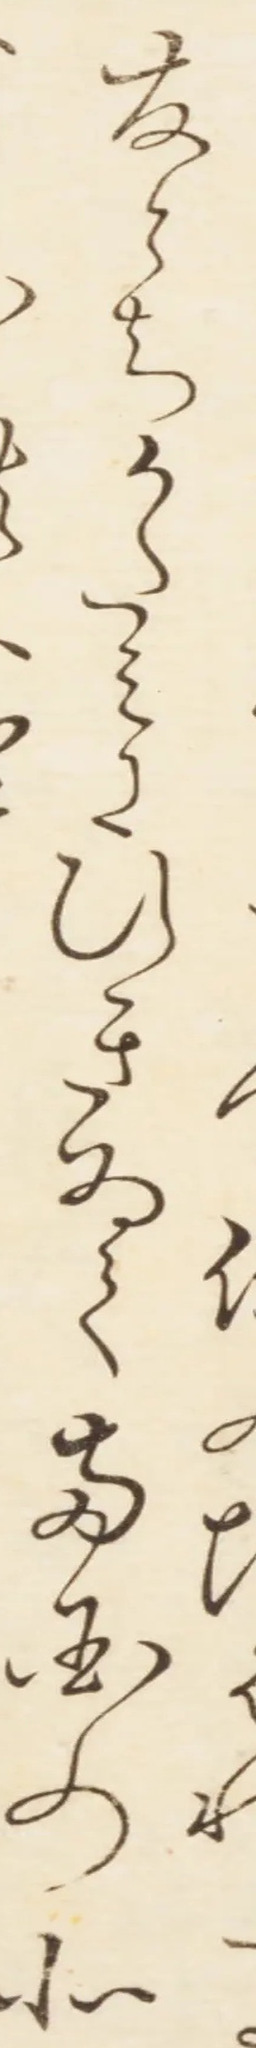友とちかたみにひきゐて両国の北
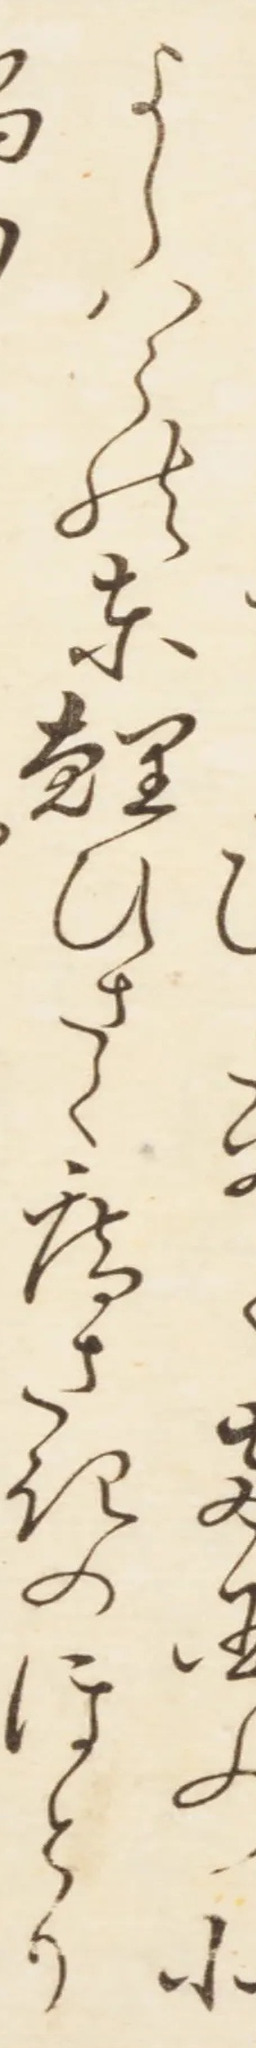よしはらの東鯉ひさく庵さきのほとり
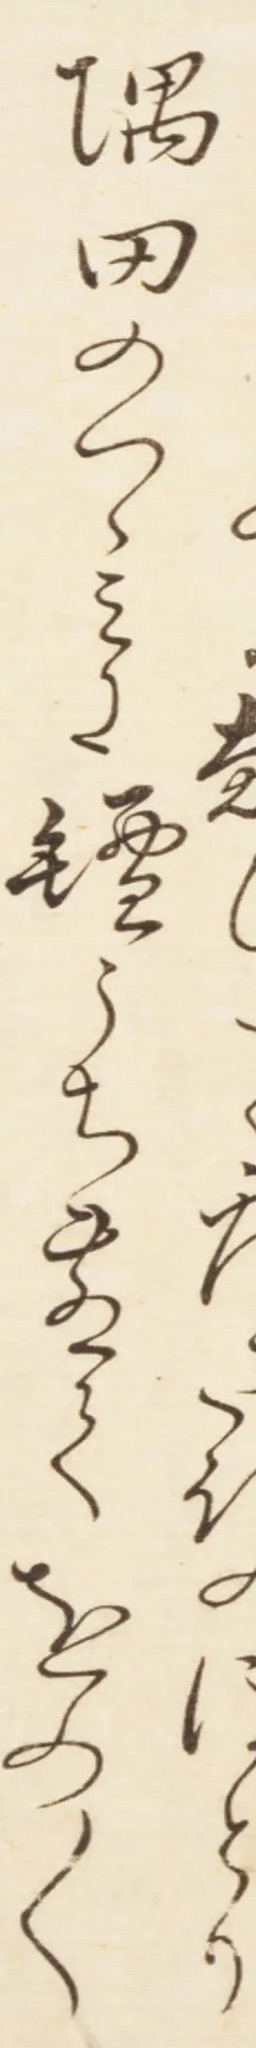隅田のつゝみに氈うち敷てをの〳〵
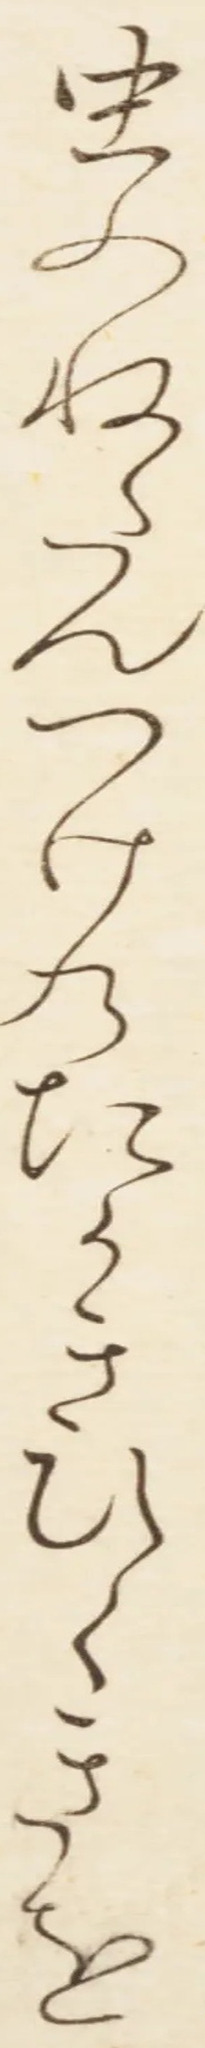虫のねたんつけのたかきひくきを
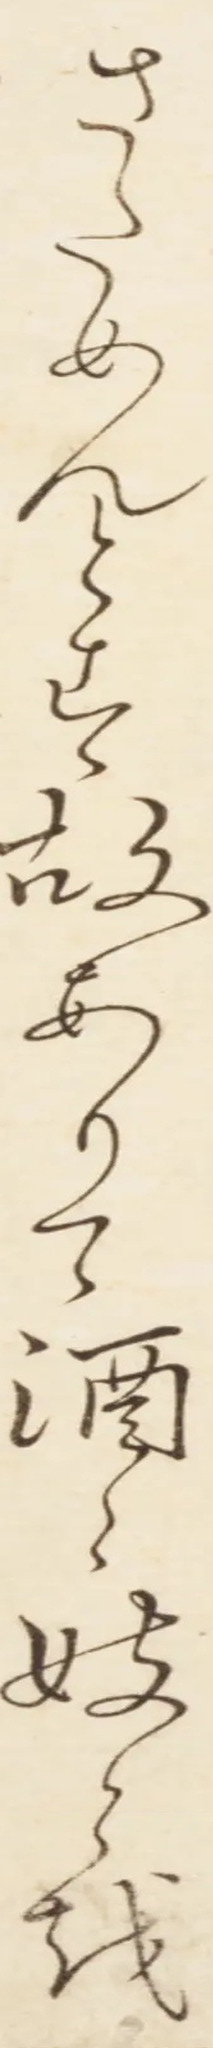さためんとす故ありて酒と妓とを
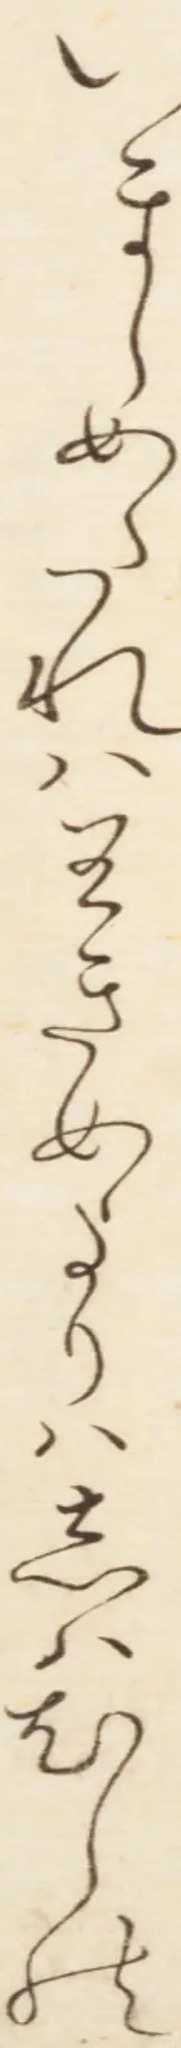いましめたれはわきめよりはしはむしの
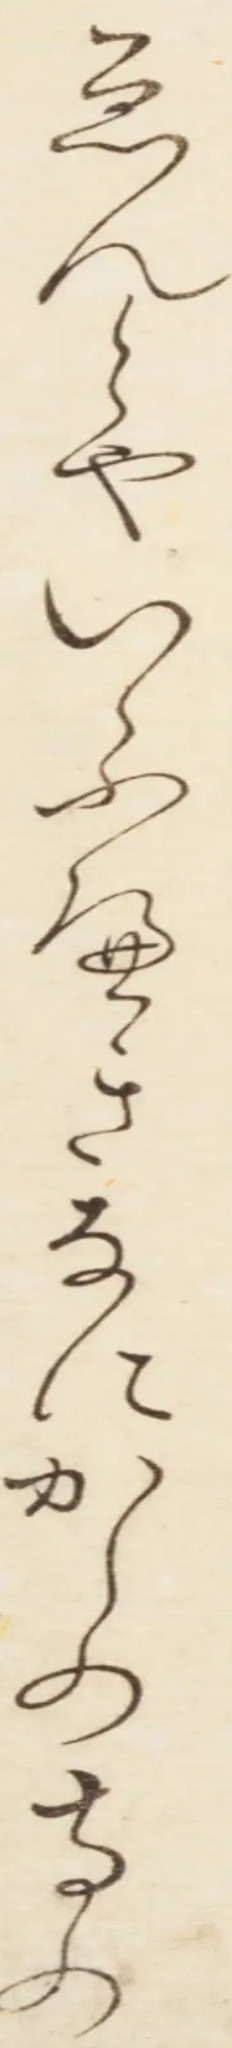ゑんとやいふへきなにかしの寺の
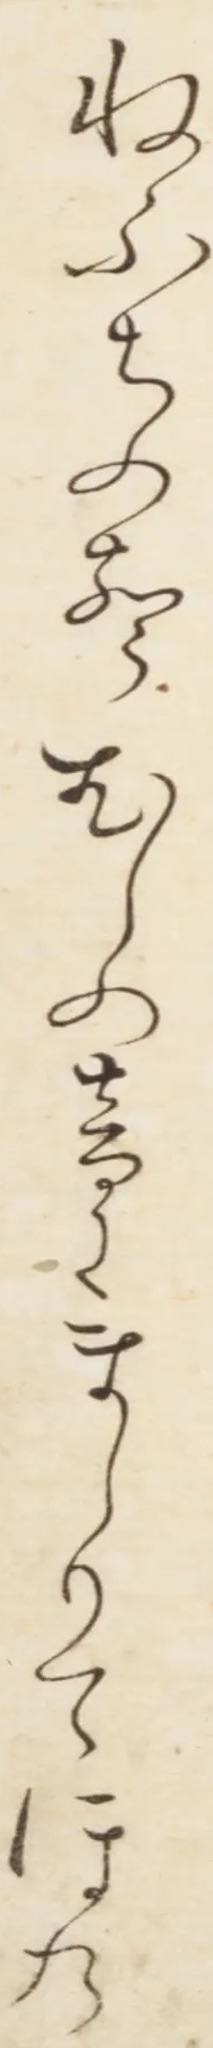ねふちの声むしの音にましりてほの

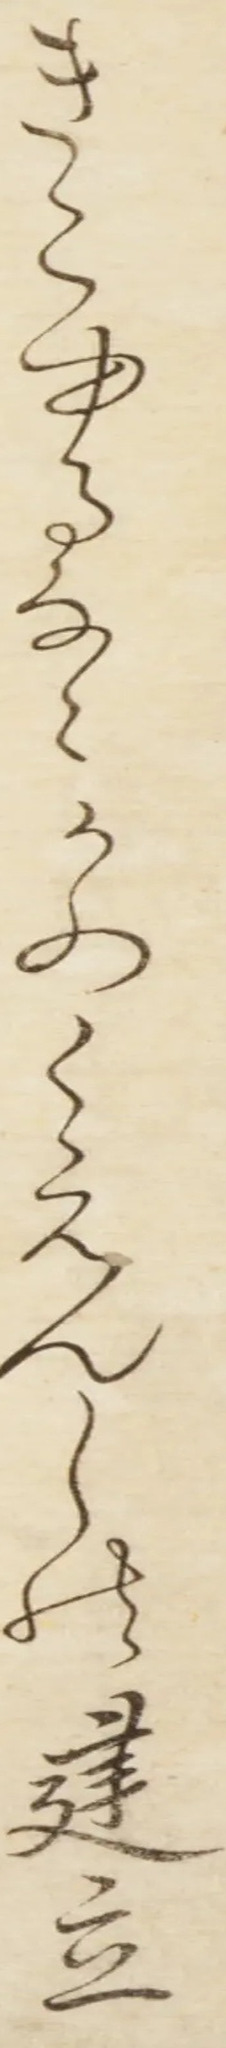きこゆるなとかのくえんしの建立
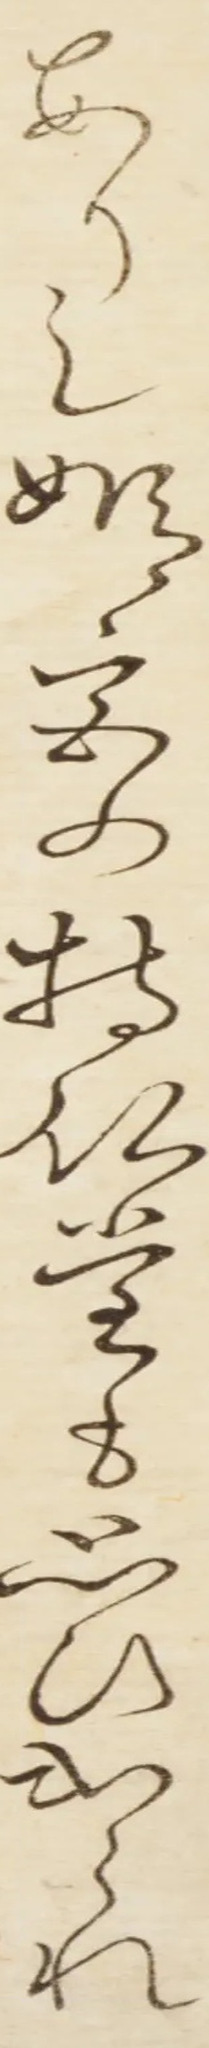ありし姫宮の持仏堂も思ひ出られ
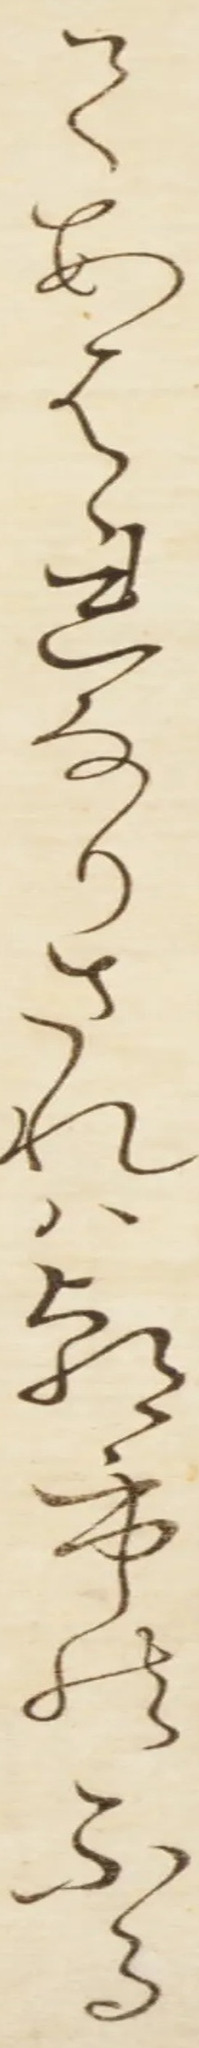てあはれなりされは朝市のふる
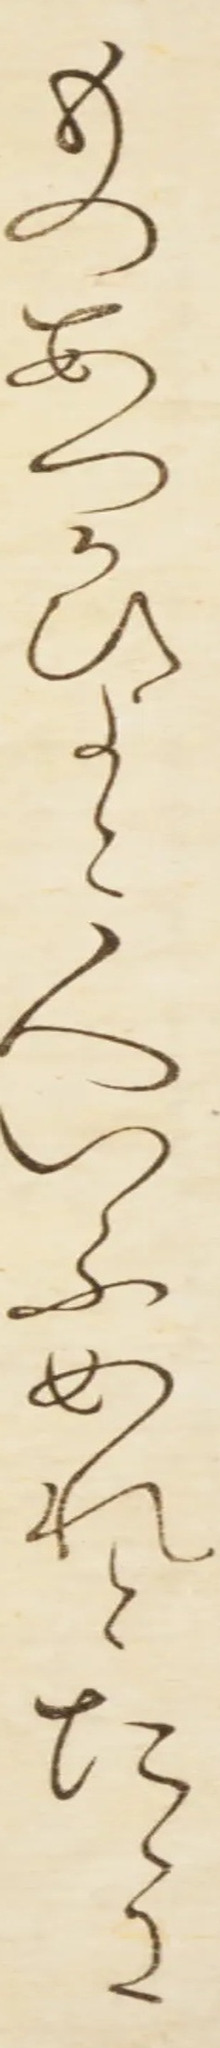ものあつかひよと人いふめれとたゝに
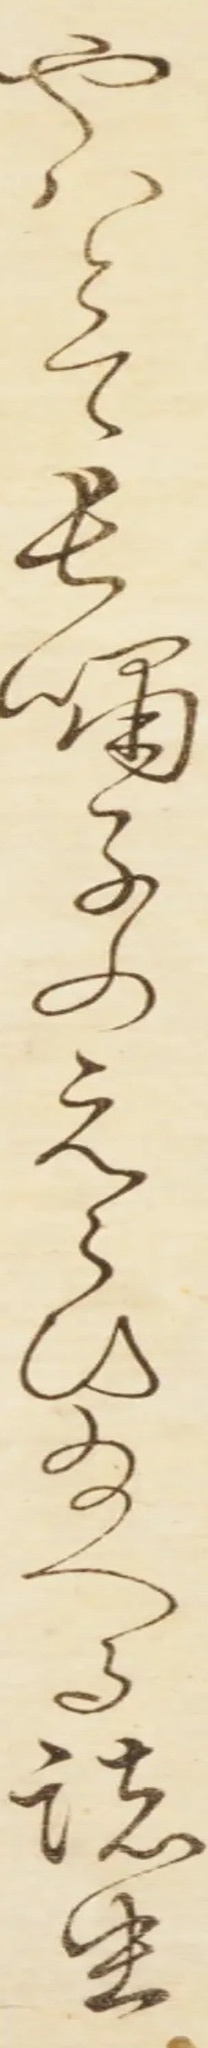やはとて長嘯子のえらひ給へる諸虫
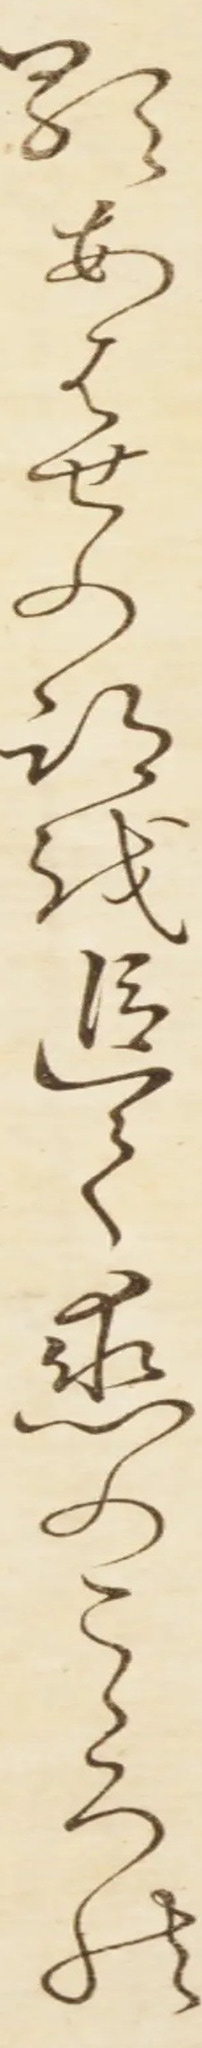歌あはせの跡を追て恋のこゝろの
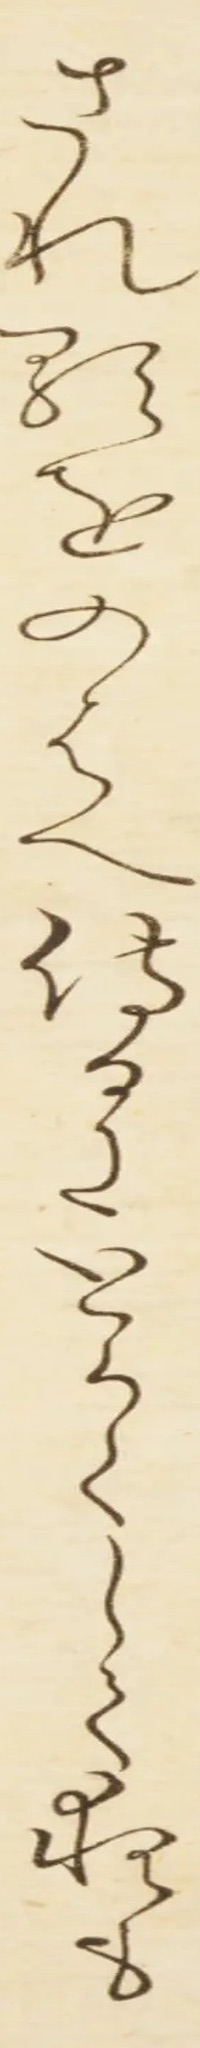され歌をのはへ侍るにとかくして夜も
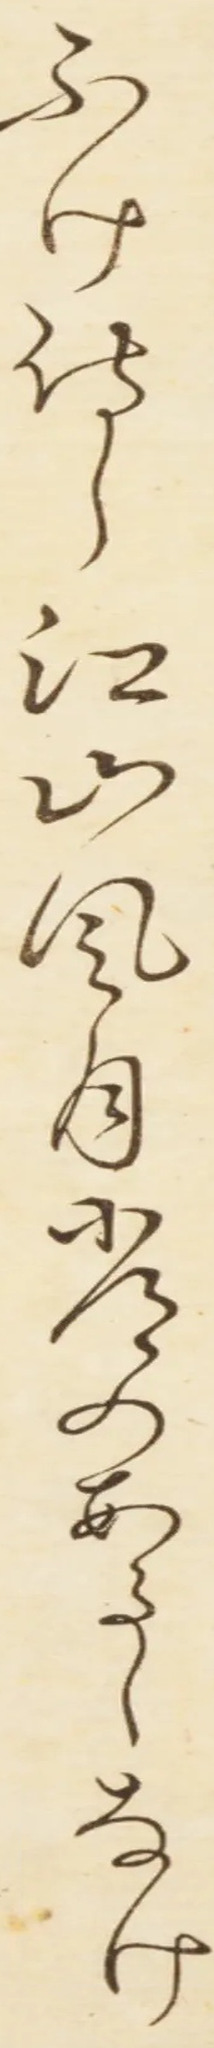ふけ侍し江山風月常のあるしなけ
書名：画本虫ゑらみ
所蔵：国立国会図書館 National Diet Library, JAPAN
